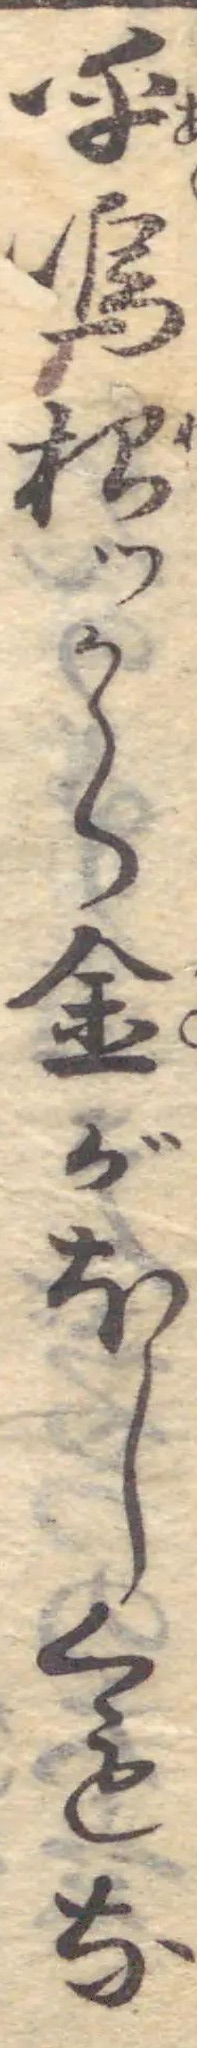嗚呼根つから金がほしくもな
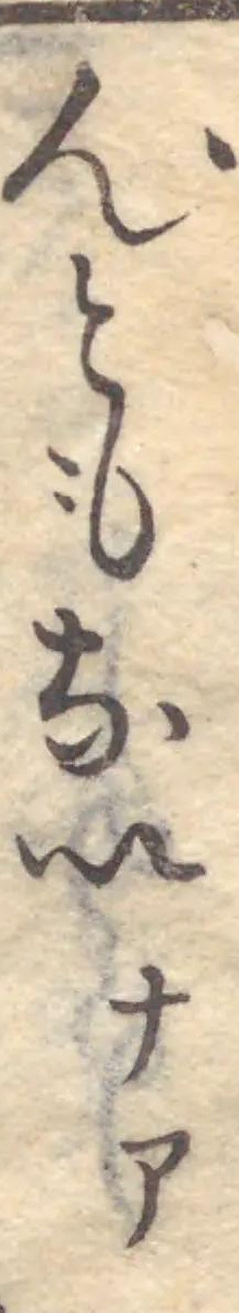んともないナア
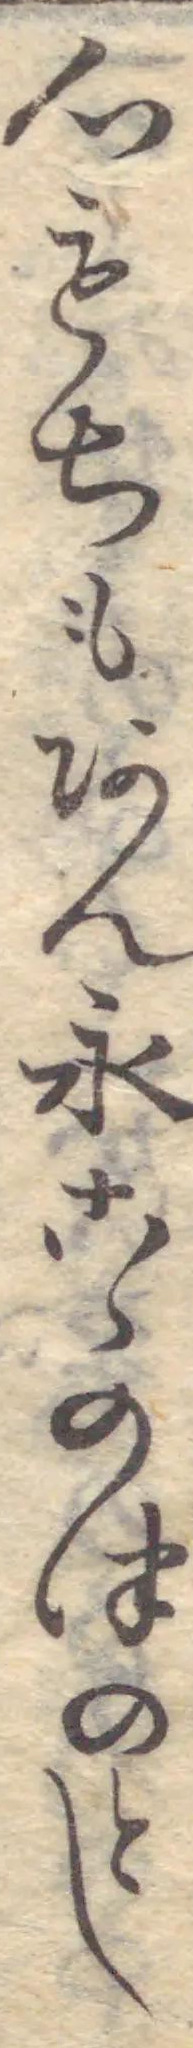心もちもあん永こゝのつのとし
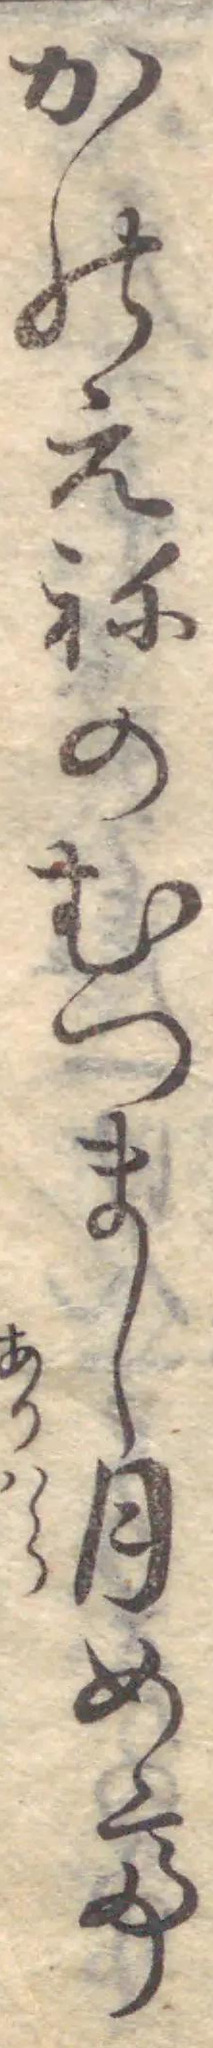かのえねのむつまし月めて
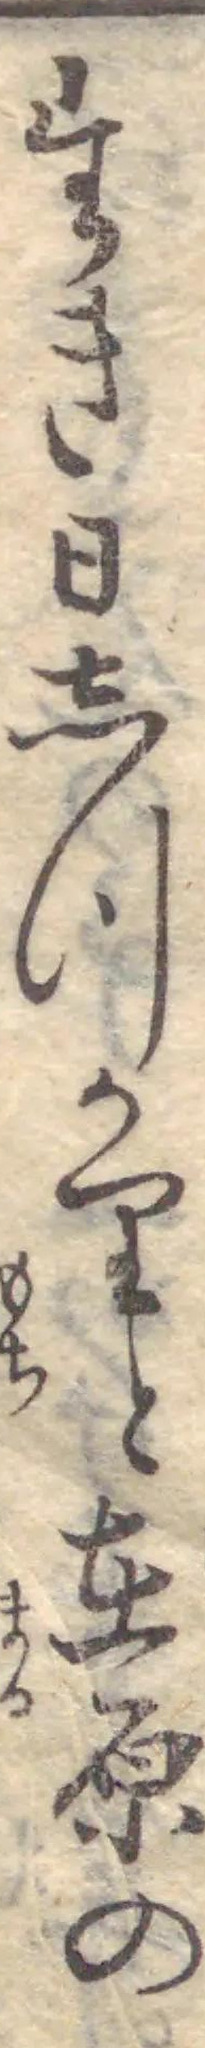たき日しつかりと在原の
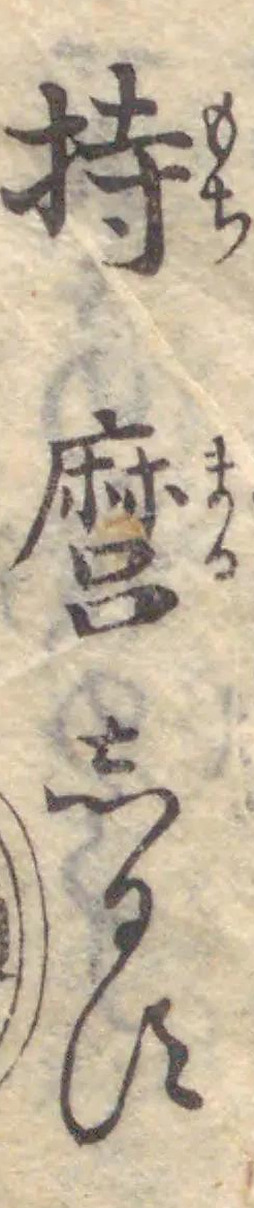持麿しるす

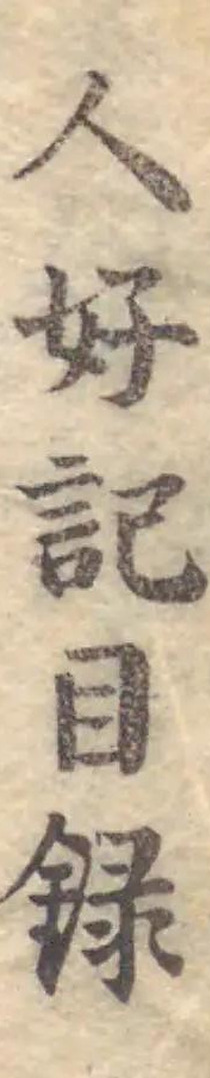人好記目録
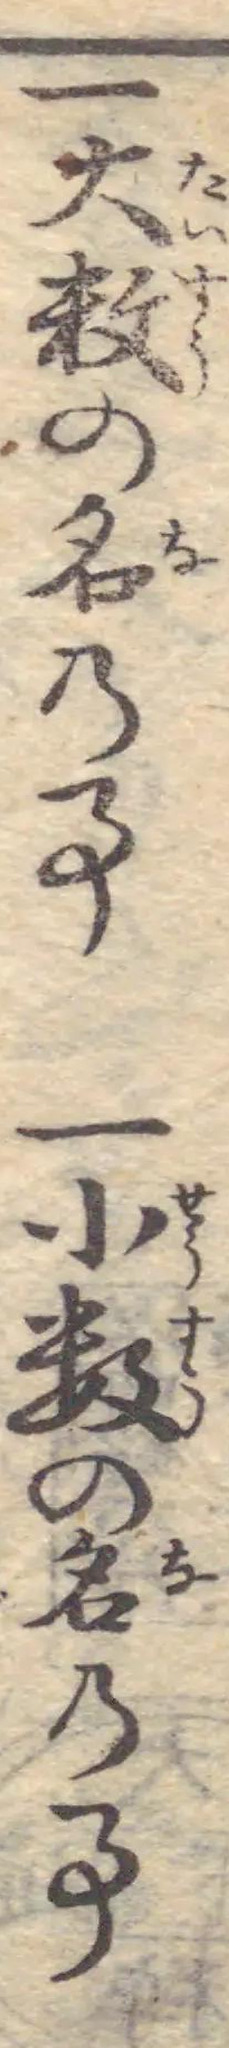一大数の名の事一小数の名の事
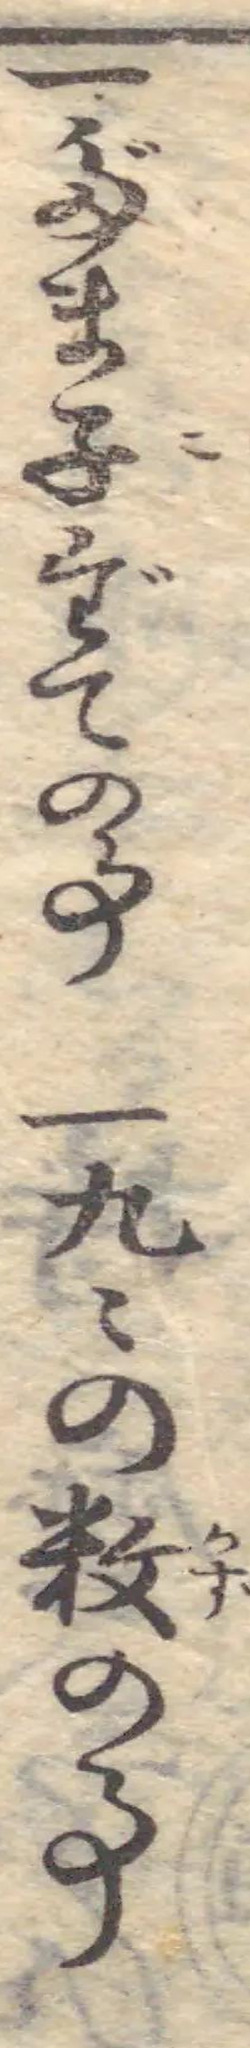一だま子だての事一九々の数の事
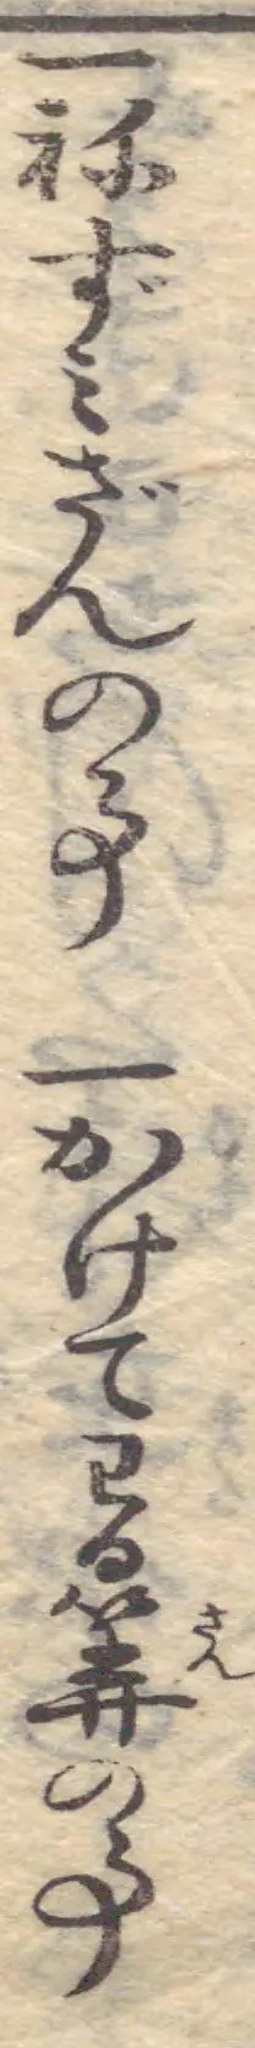一ねずみざんの事一かけてわる算の事
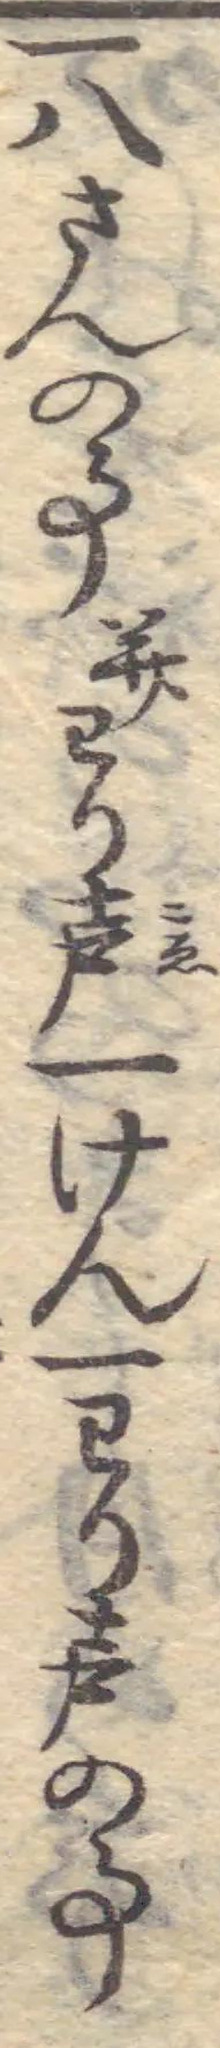一八さんの事并わり声一けん一わり声の事
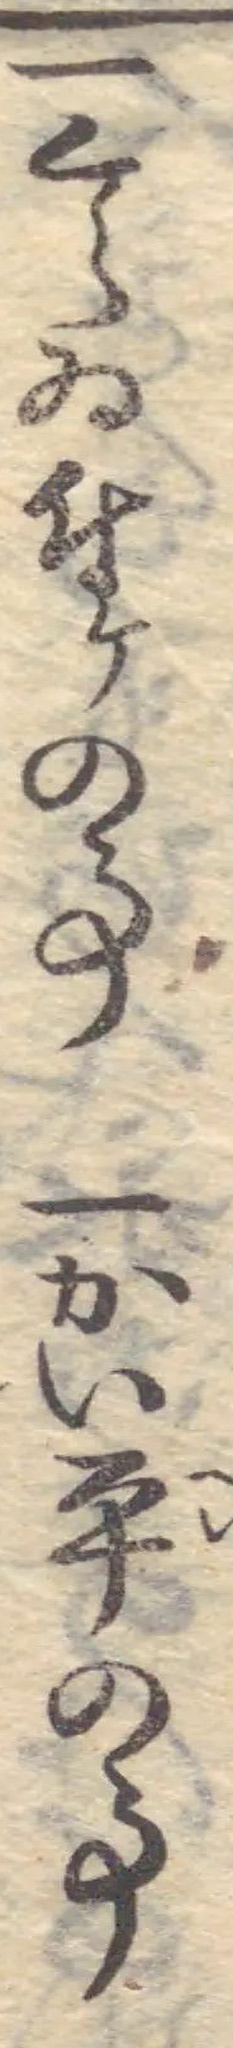一くらゐ付けの事一かい平の事
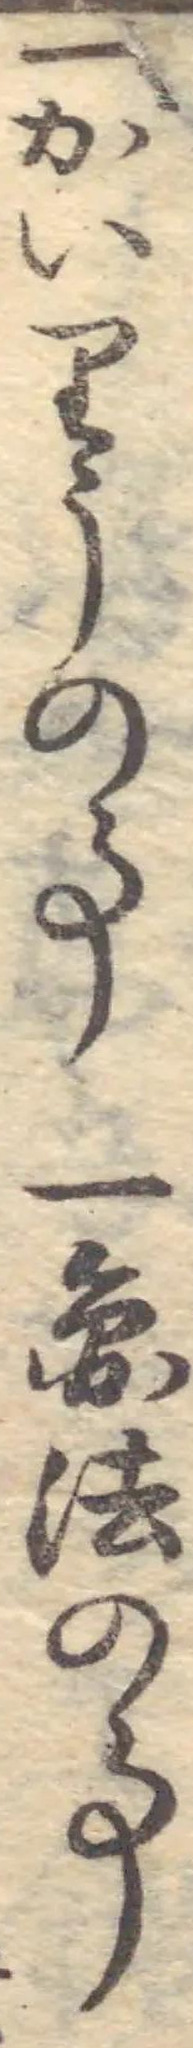一かいりうの事一円法の事
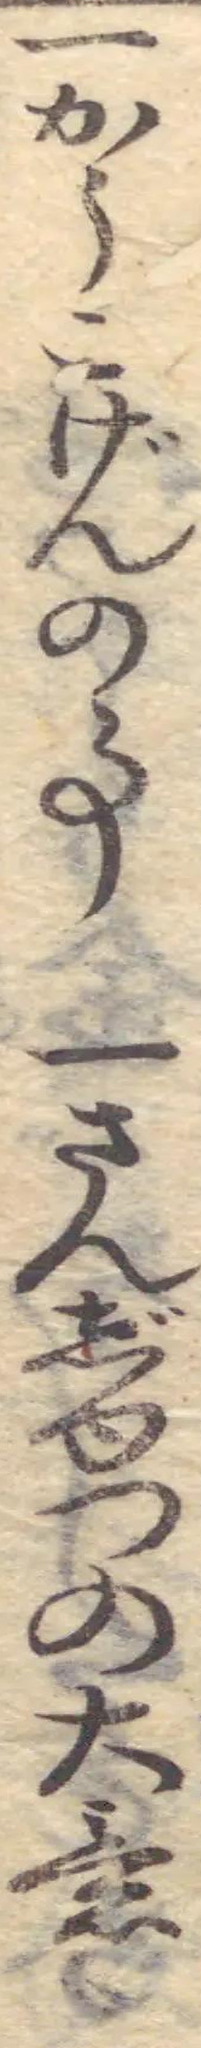一かうこげんの事一さんじゆつの大意
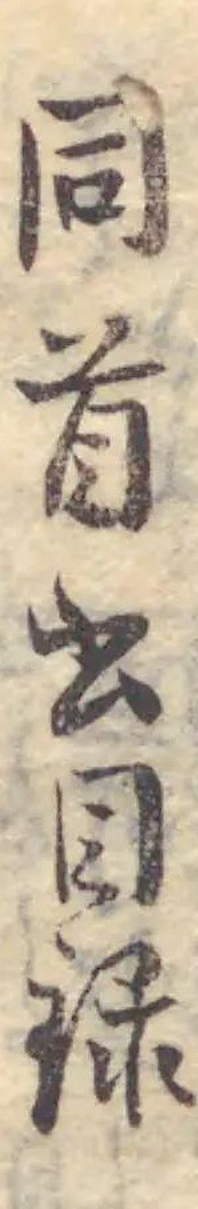同首書目録
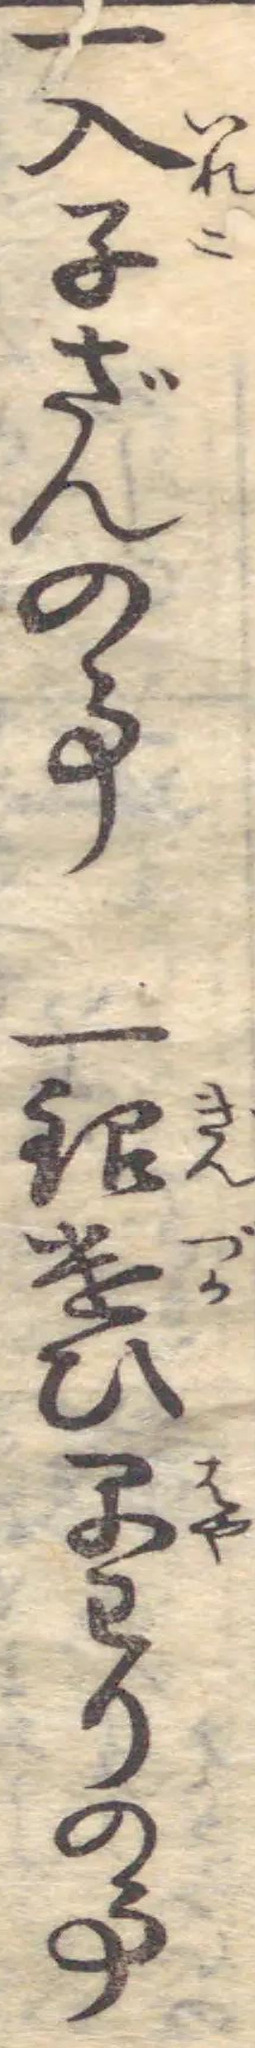一入子ざんの事一銀遣ひ早わりの事
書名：大通人好記
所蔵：国立国会図書館 National Diet Library, JAPAN
